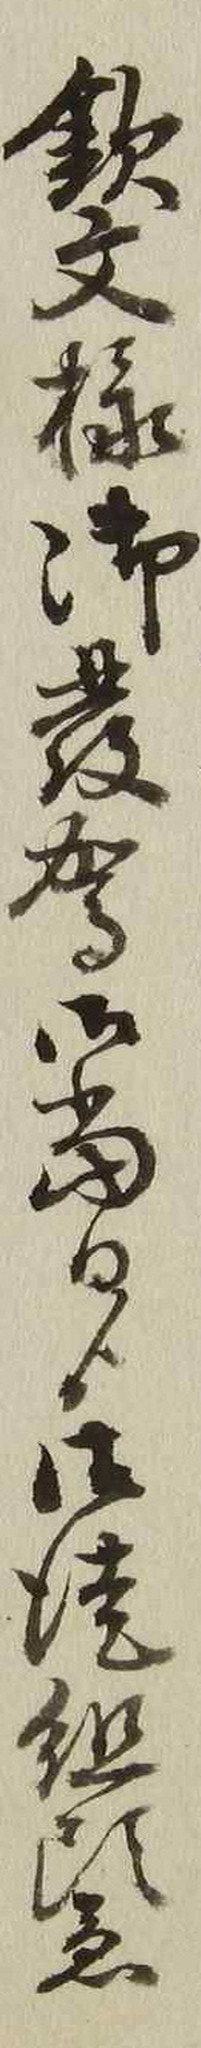欽文様御発駕御当日ゟ御徒組頭兼
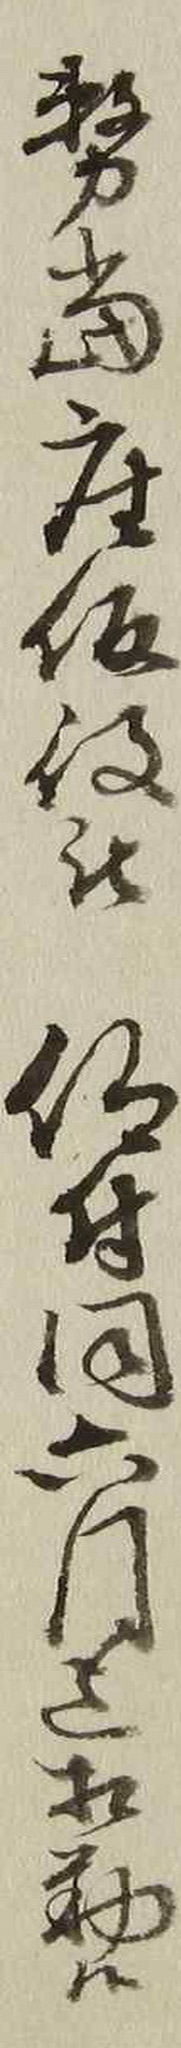務当座仮役被仰付同六月迄相勤候
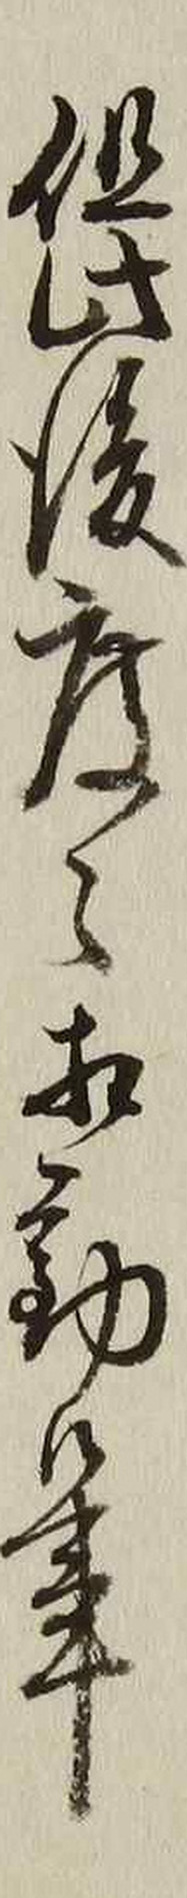但此後度々相勤候事
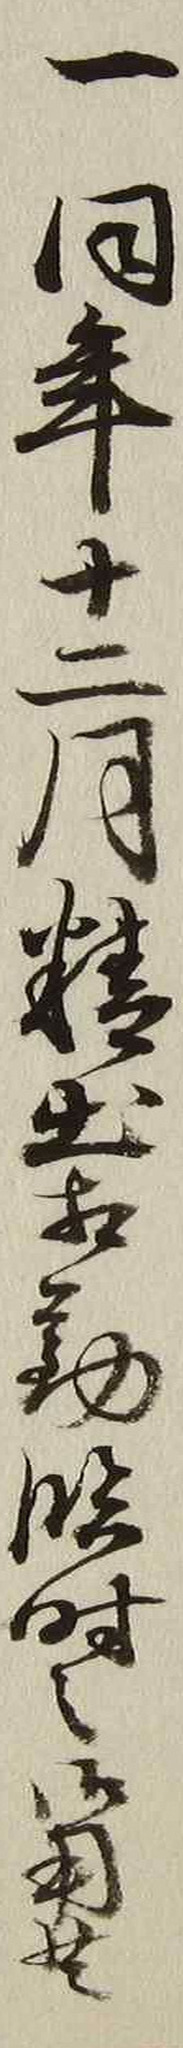一同年十二月精出相勤臨時之御用共
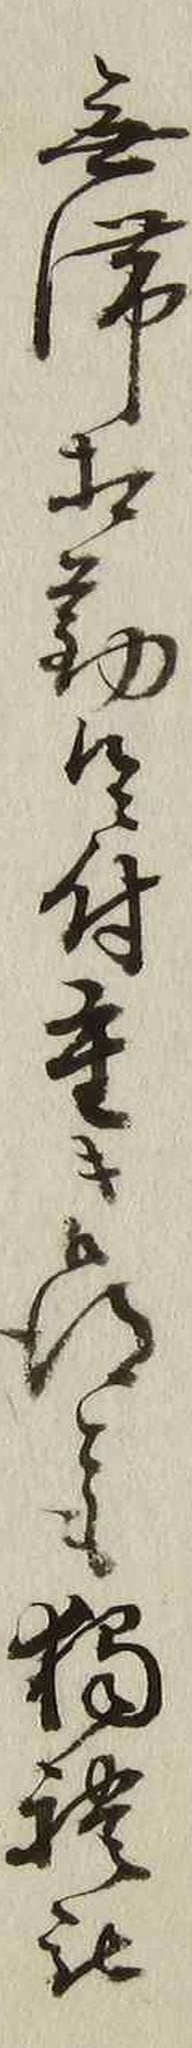無滞相勤候ニ付重キ候得とも独礼被
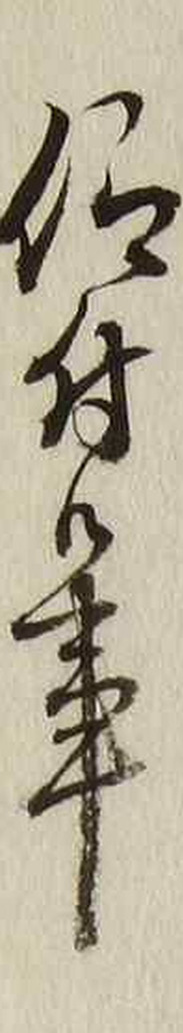仰付候事
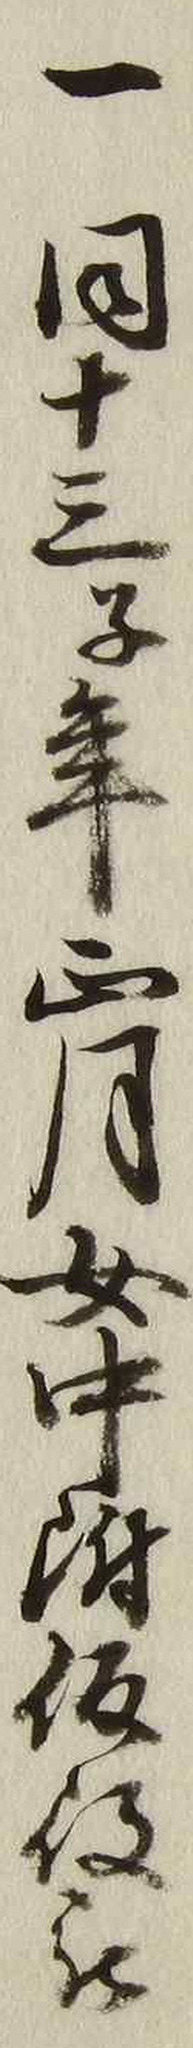一同十三子年正月女中附仮役被
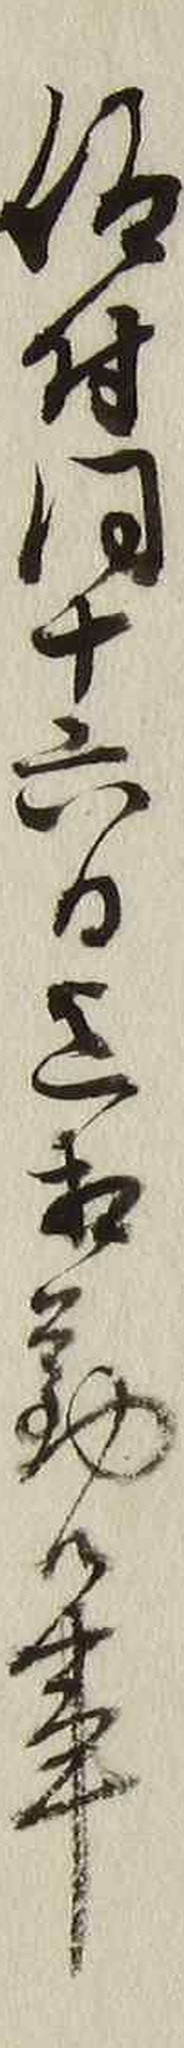仰付同十六日迄相勤候事
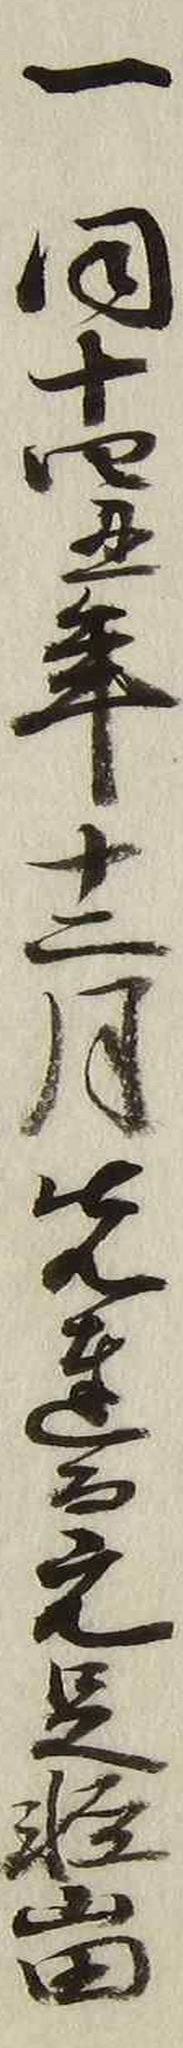一同十四丑年十二月先達而元足軽山田
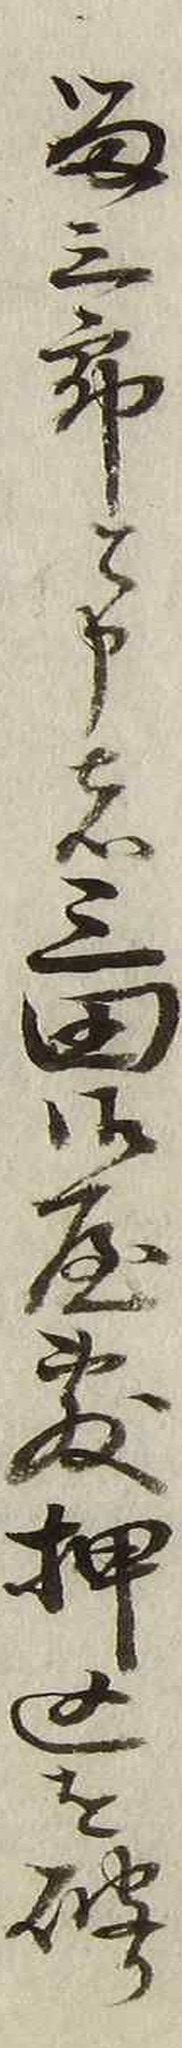留三郎と申者三田御屋敷押込を破り
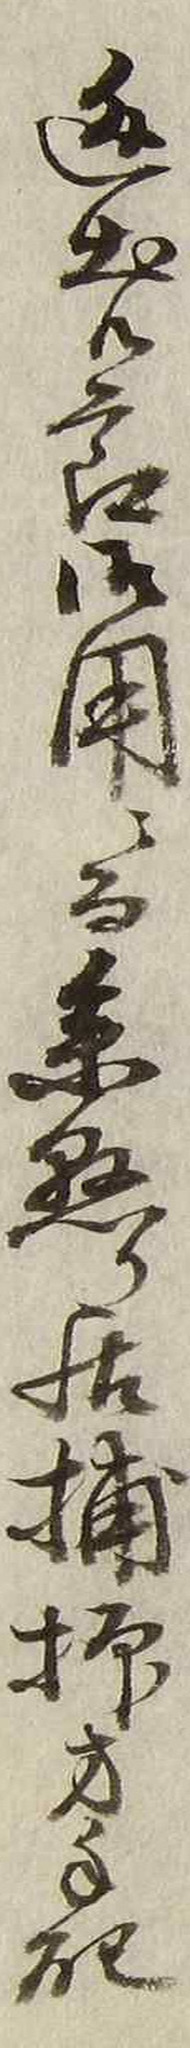逃出候節御用ニ而参懸り居捕抑方手配
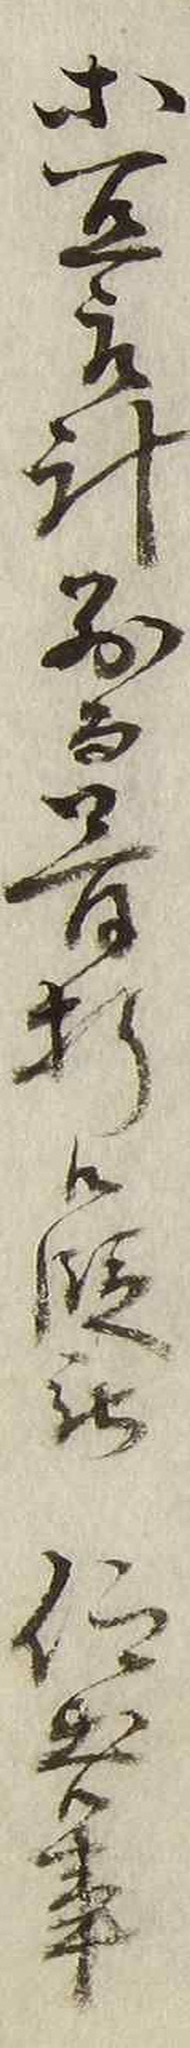等宜取計別而骨折候段被仰出候事

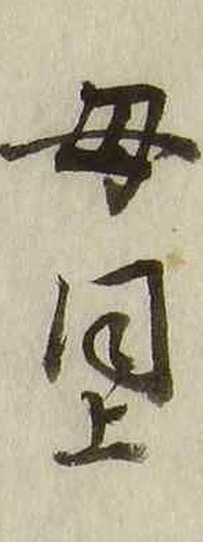母同上
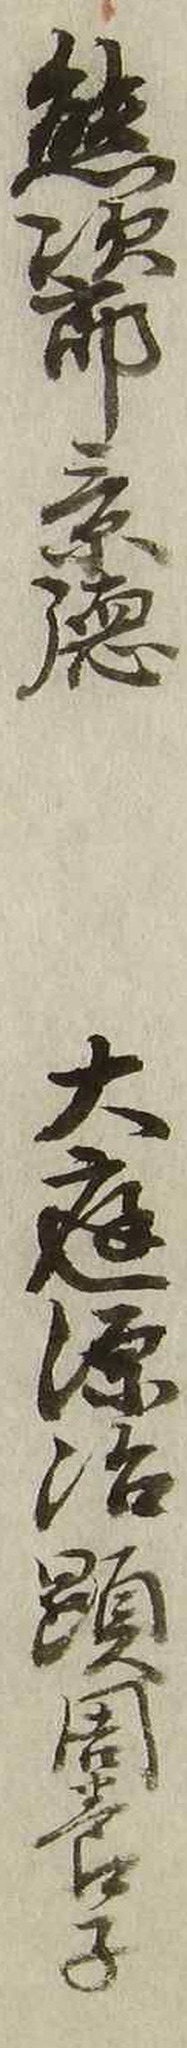熊次郎景徳大庭源治顕周養子
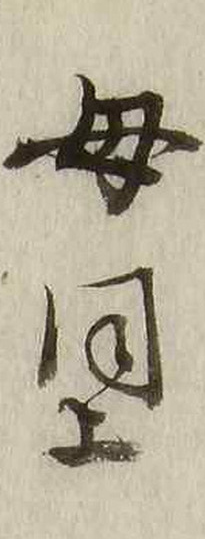母同上
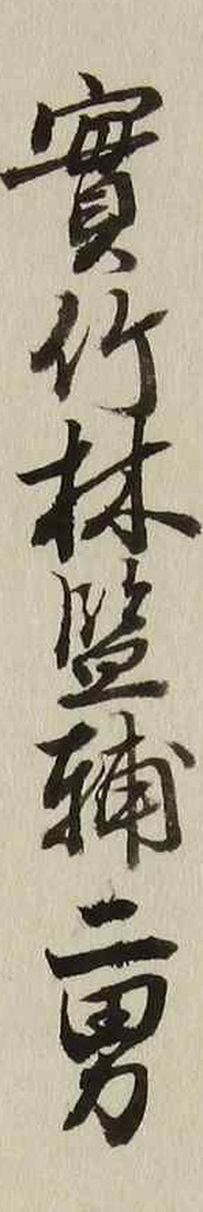実竹林監輔二男
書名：諸士系譜　巻之39　は之部7
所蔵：会津若松市立会津図書館
